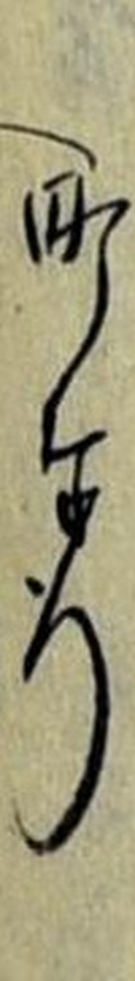町奉行
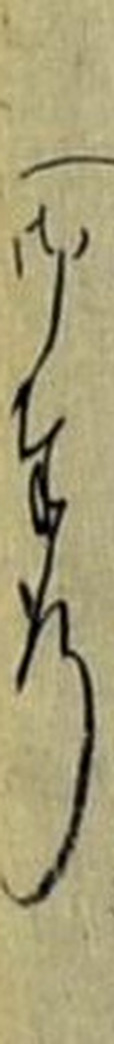御奉行
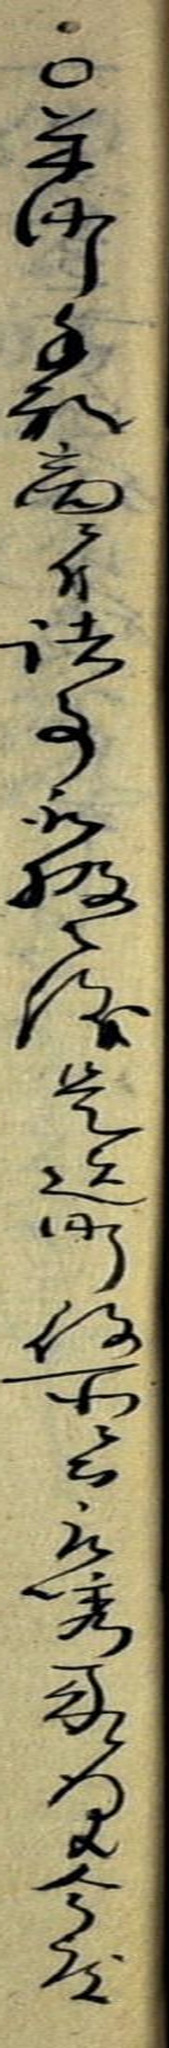○米町手形商に付諸事取扱之儀是迄役所ニ而取唀来候得共今度
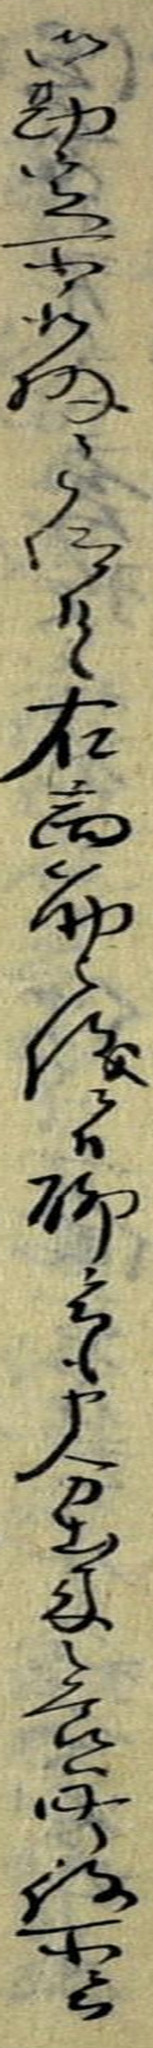御勘定所取扱ニ被仰付候右商筋之儀ニ付聊ニ而も申分出来之節ハ町役所ニ而
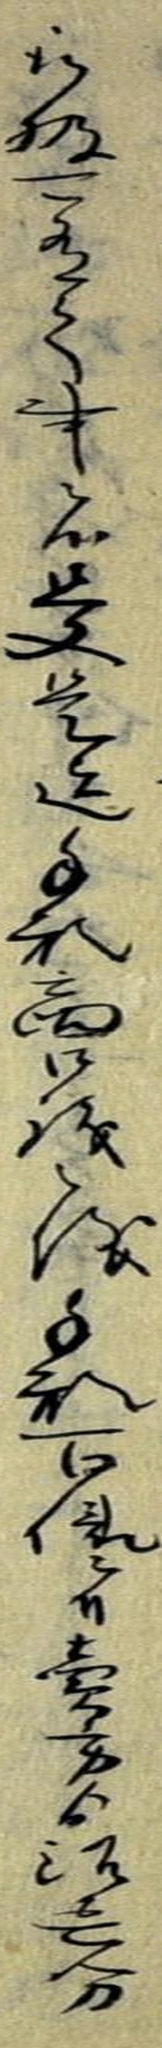取扱可有之事ニ候且又是迄手形商口銭之儀手形百俵ニ付売方ゟ銀壱分
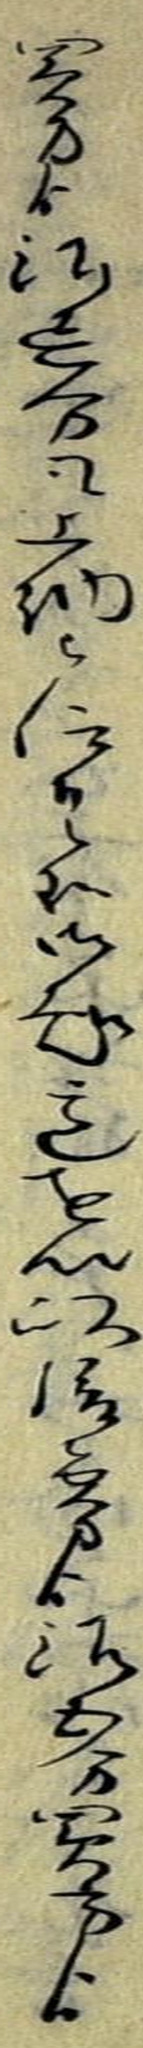買方ゟ銀壱分ツヽ上納仰付候処御趣意を以以後売方ゟ銀五分買方ゟ
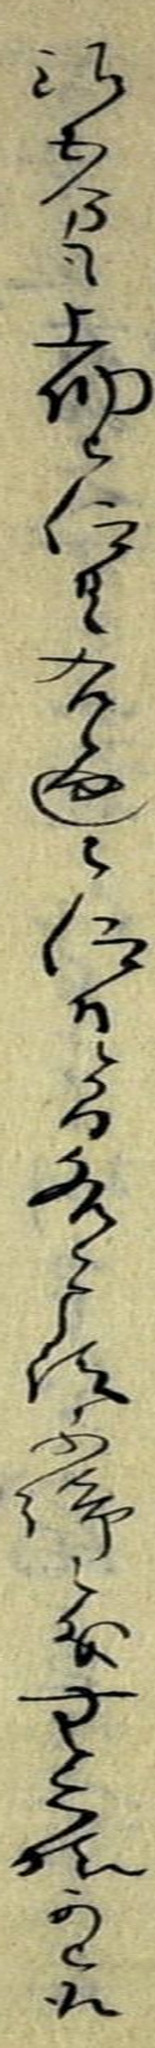銀五分ツヽ上納被仰付候右之通被仰付候間各被申談不締之義無之様可被取
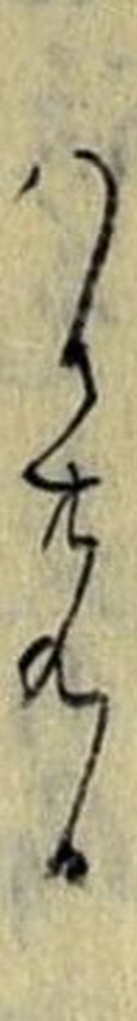八月廿九日
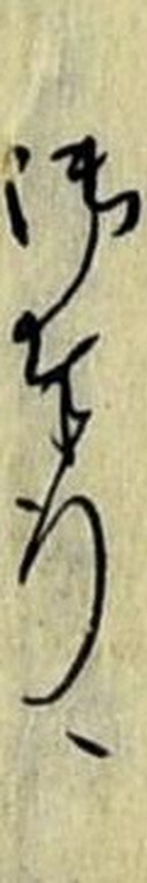御奉行
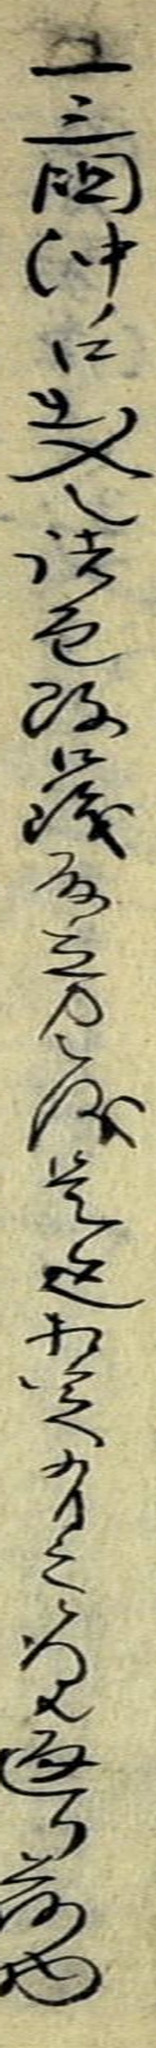一三国沖ノ口出入之諸色改口銭取立方之儀是迄相定有之候得共返り荷物
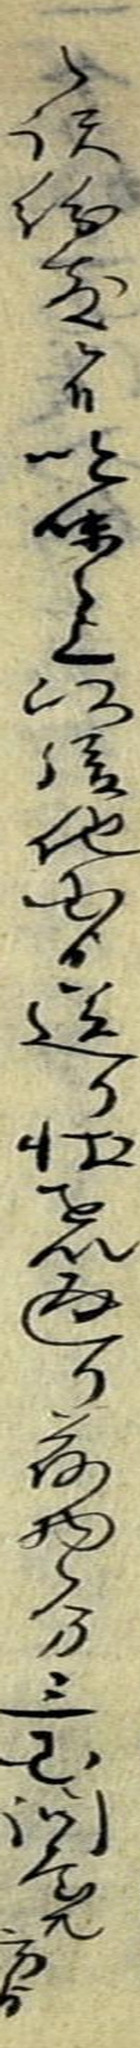之訳紛敷ニ付吟味之上以後他国ゟ送り状を以返り荷物之分三国問屋共方ゟ
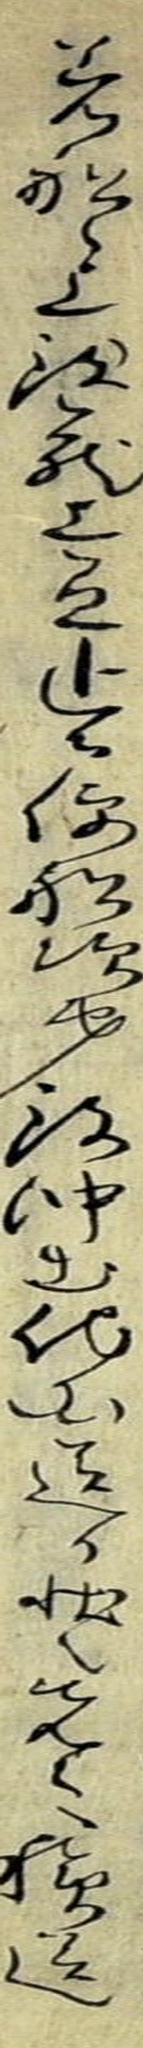着船之上致蔵上置追う而便船次第致沖出他国送り状之先々へ積送
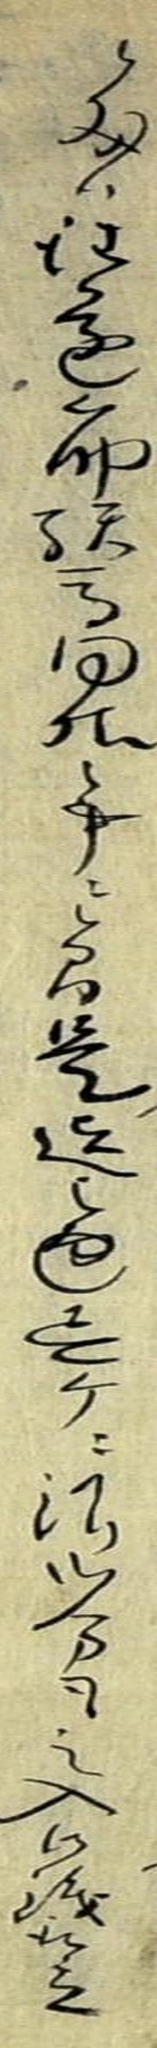之義ハ往還筋駅馬同様之事ニ候間是迄之通壱ケニ銀弐分ツヽ之入口銭取立
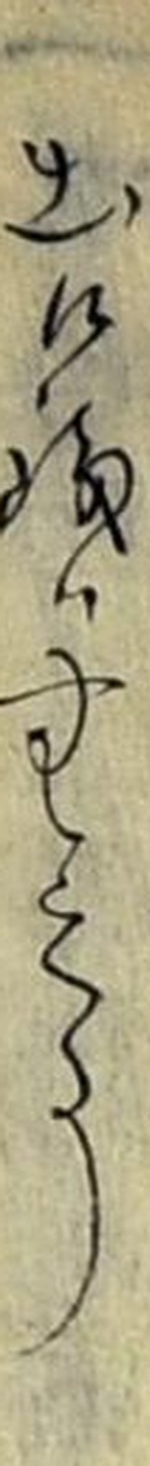出口銭ハ無之事
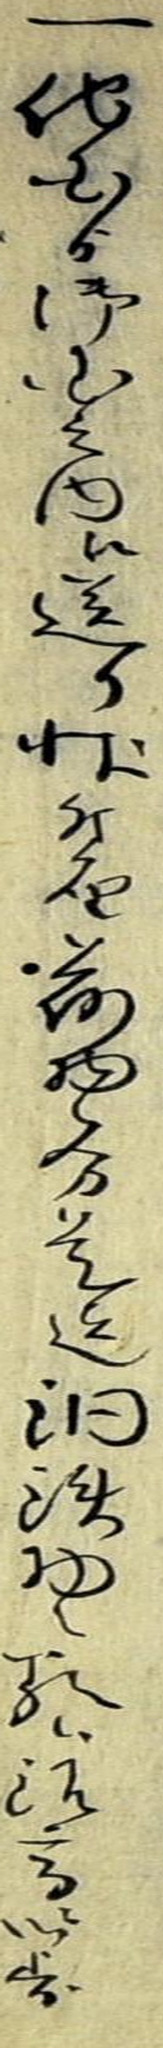一他国ゟ御国之内江送り状付届荷物之分是迄銅鉄物之類ハ銀高ニ弐歩
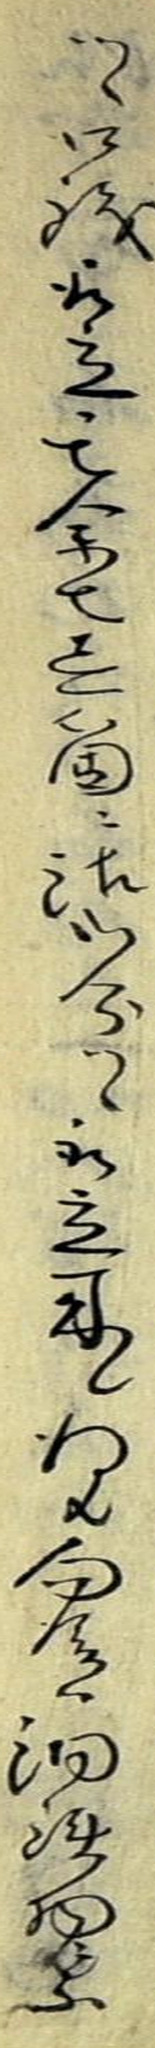ツヽ口銭取立其余者壱箇ニ銀弐分ツヽ取立来候得共向後ハ銅鉄物ニ不
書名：命令之部 三
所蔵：福井県文書館 Fukui Prefectural Archives
